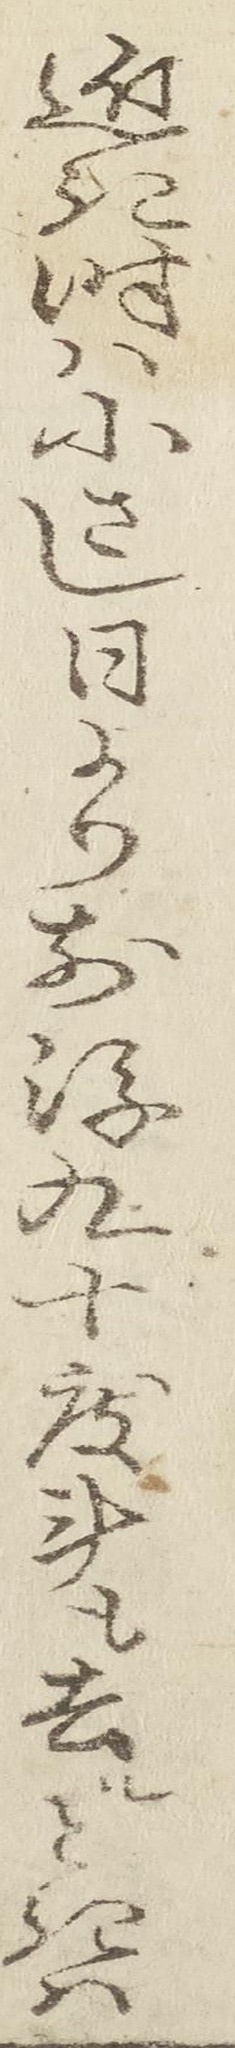近き時は小さし日より前後九十度計も去ルときは
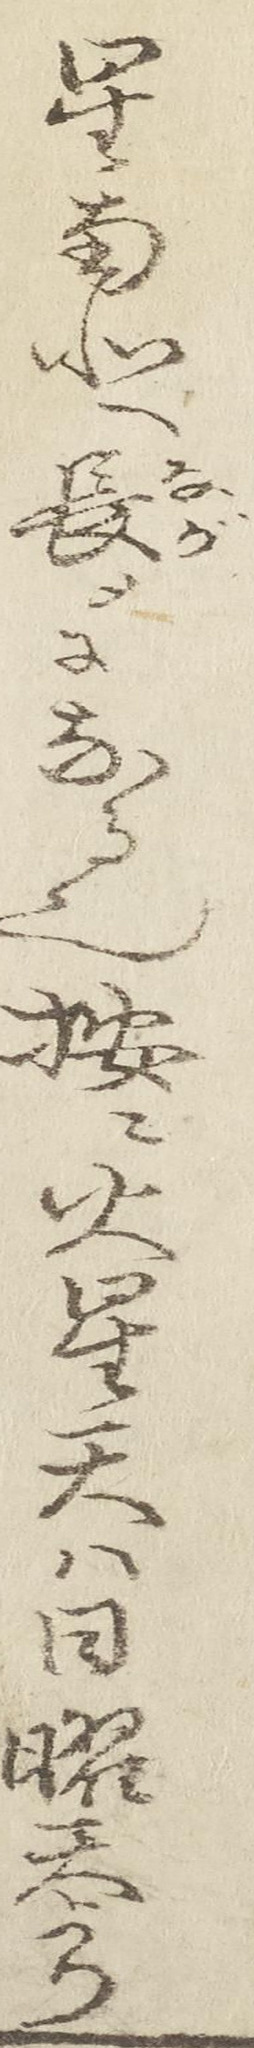星南北へ長メになる也按ニ火星天は日曜天より
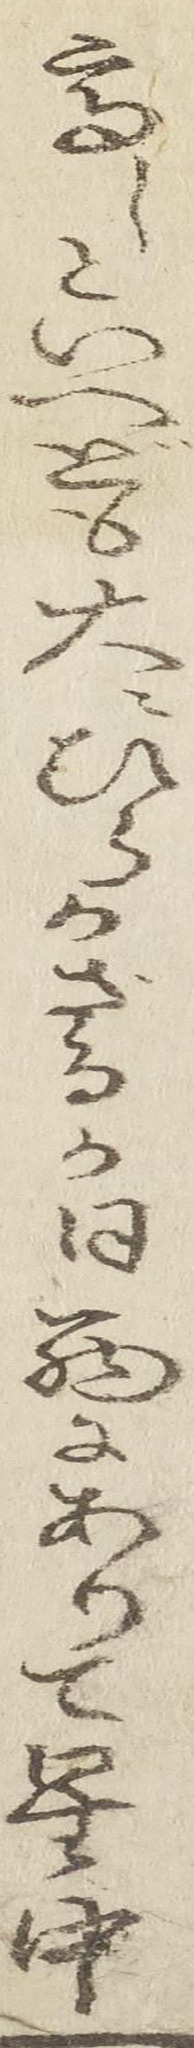高しといへども大ニひらかさるか日西にありて星中
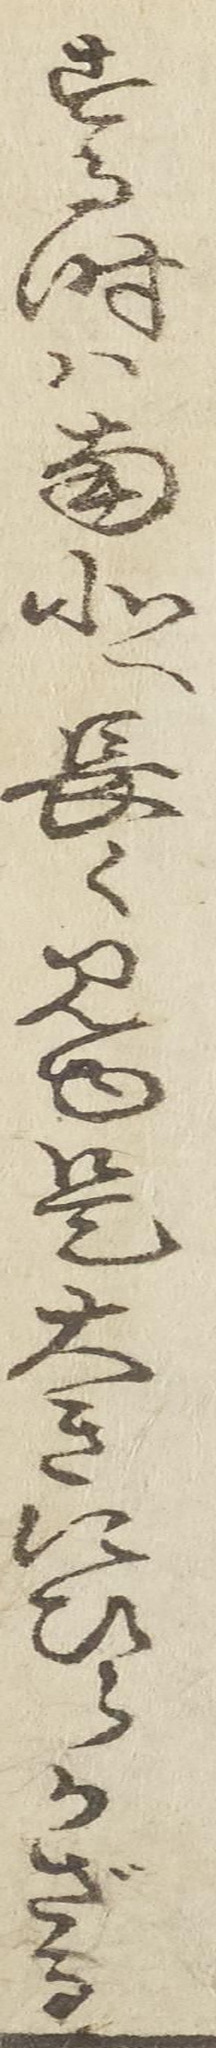する時は南北へ長く見ゆ是大きにひらかざる
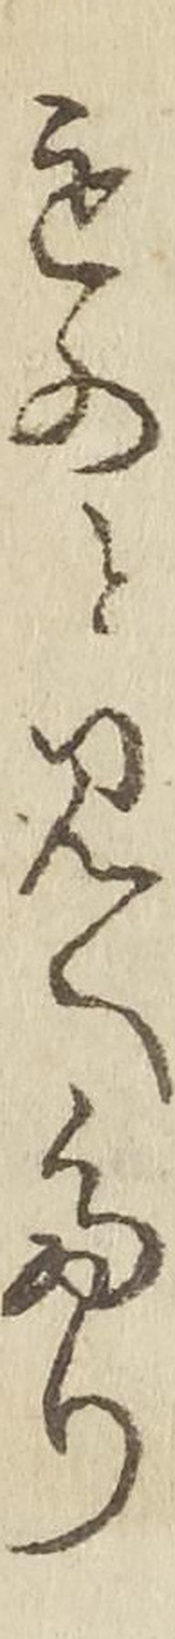ものと見へたり

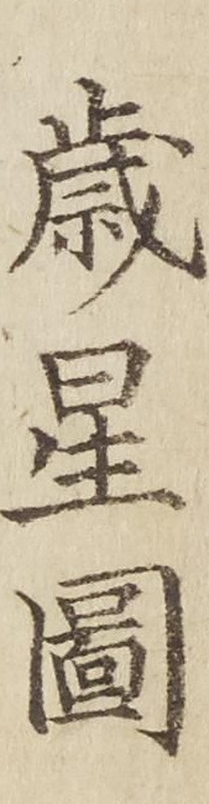歳星図
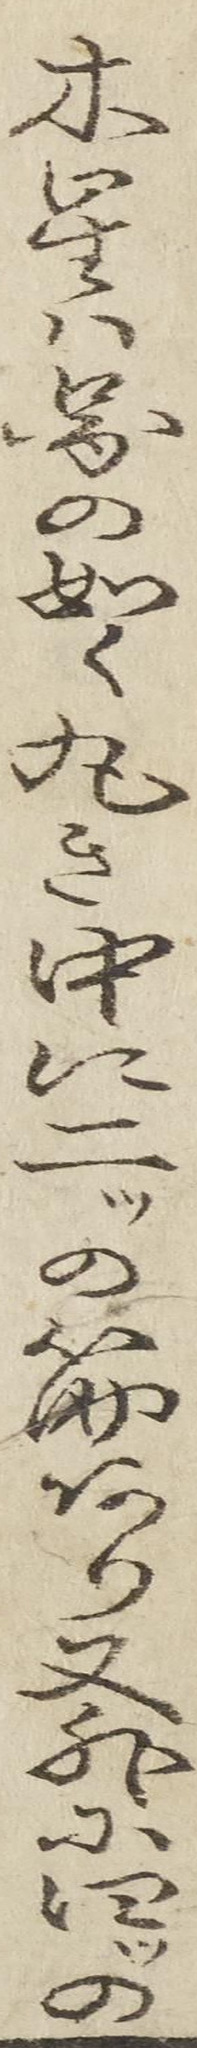木星は図の如く丸き中に二ツの節あり又外に四ツの
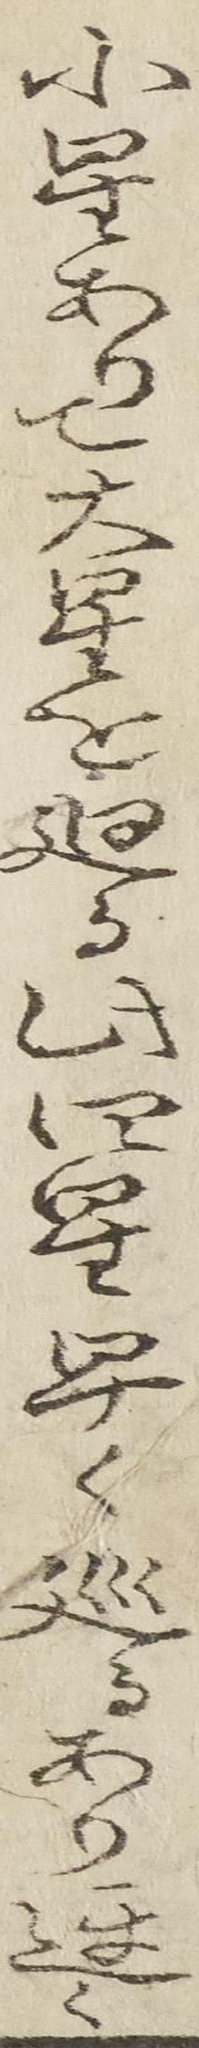小星ありて大星を廻る此四星早く巡るあり遅く
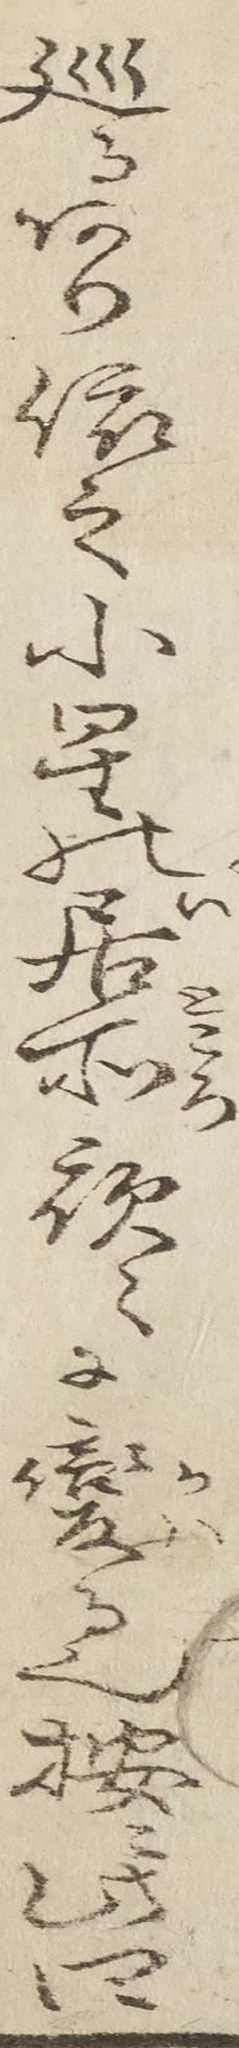巡るあり依之小星の居所夜々に変る也按ニ此四
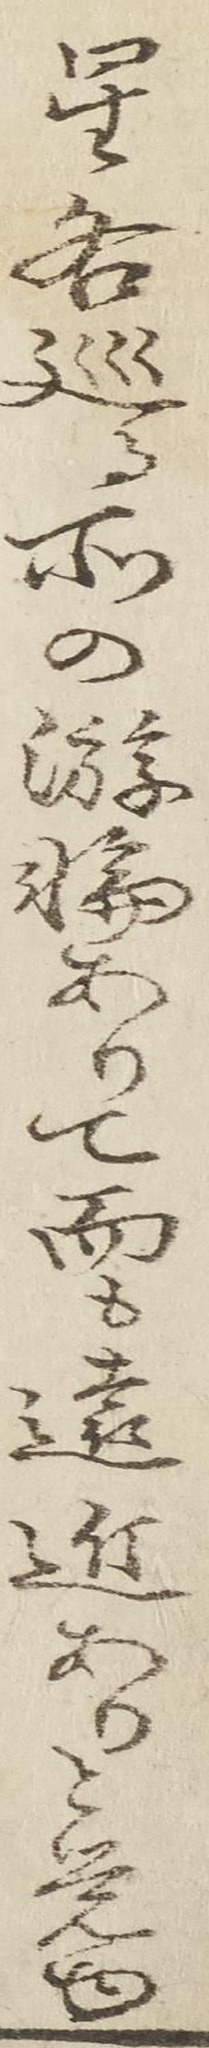星各巡る所の游輪ありて而も遠近ありと覚ゆ
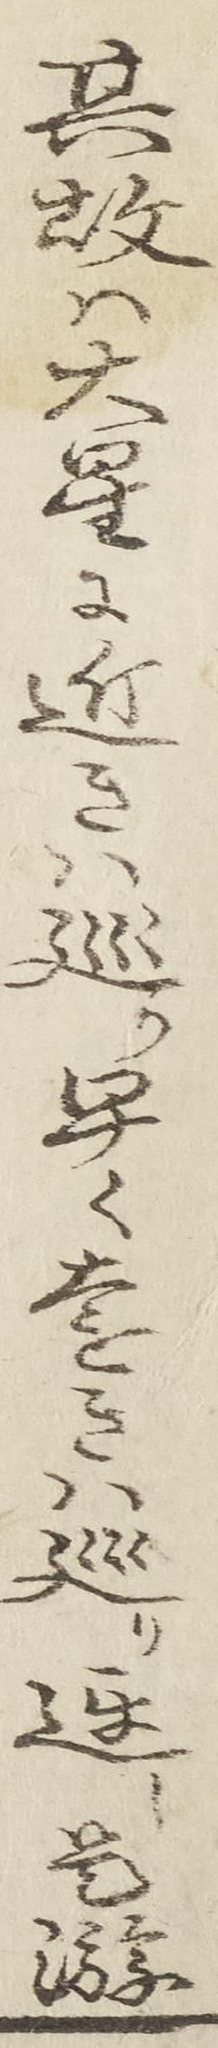其故は大星に近きは巡り早く遠きは巡り遅し是游
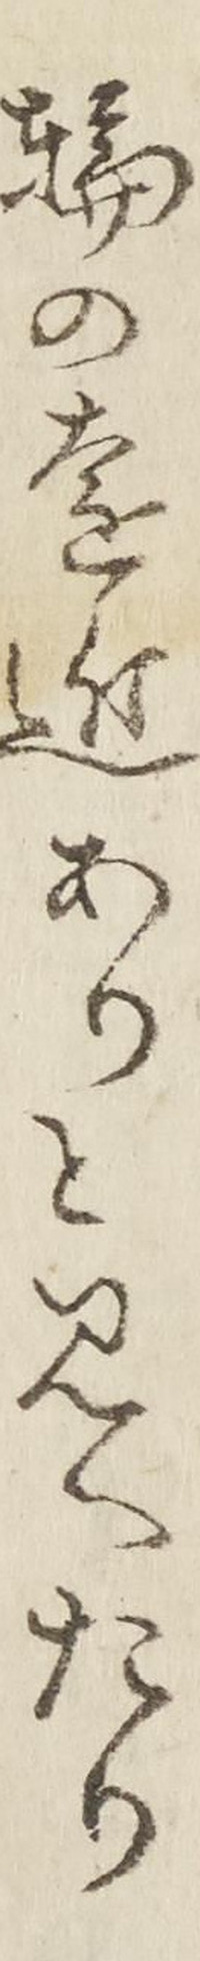輪の遠近ありと見へたり
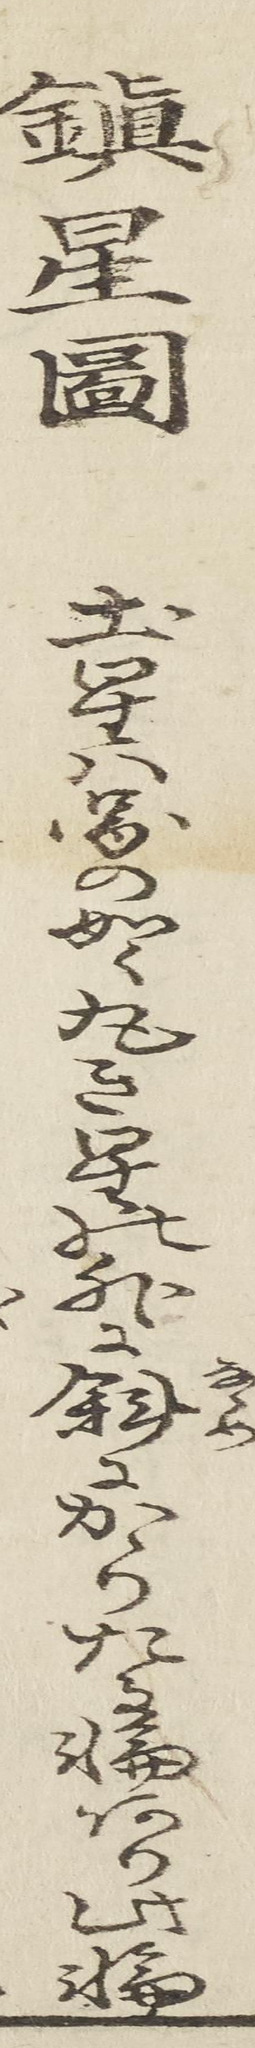土星は図の如く丸き星の外に斜にかゝりたる輪あり此輪
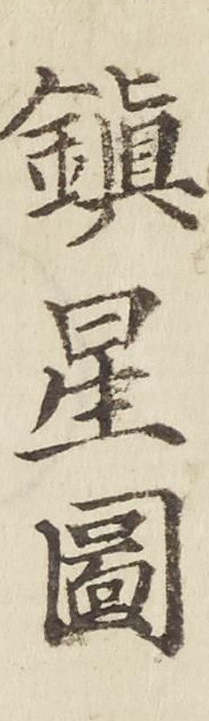鎮星図
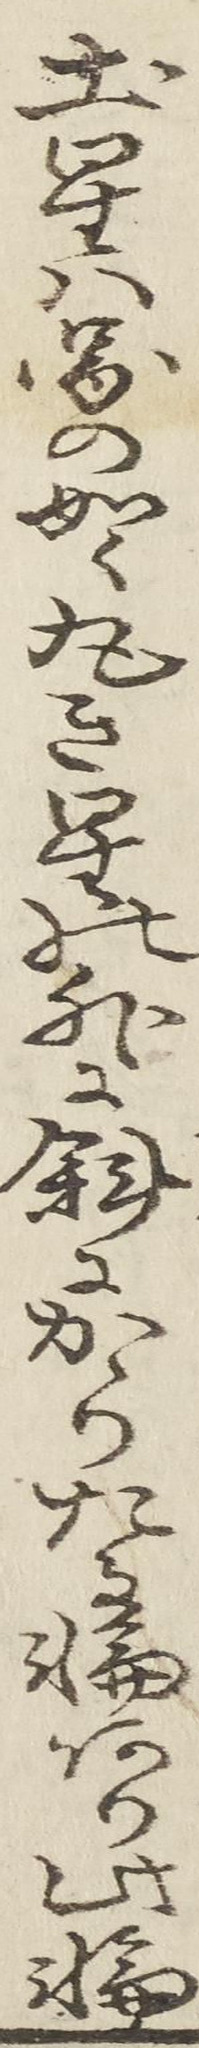土星は図の如く丸き星の外に斜にかゝりたる輪あり此輪
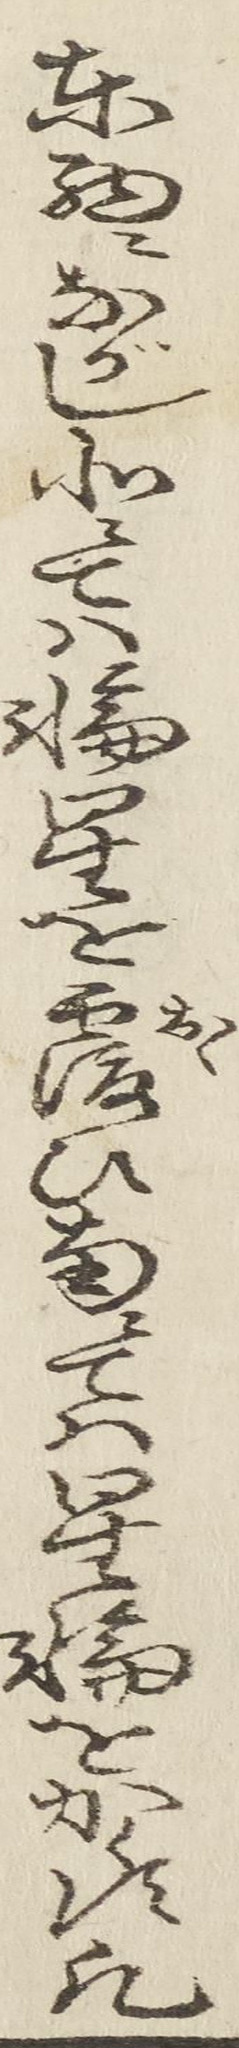東西ニながし北ニては輪星を覆ひ南ニては星輪をかくす凡
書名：平天儀圖解
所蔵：東京大学地震研究所図書室 Earthquake Research Institute Library, The University of Tokyo, JAPAN
